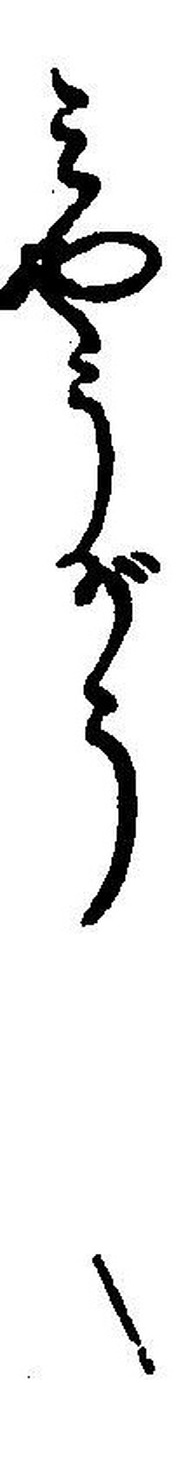みやうがう
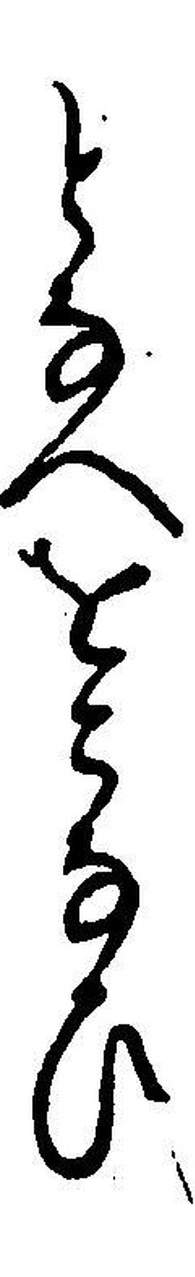となへをこなひ
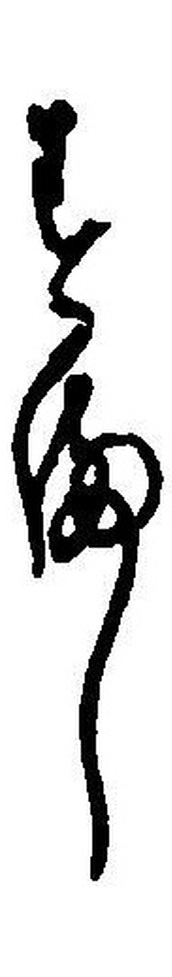すまし
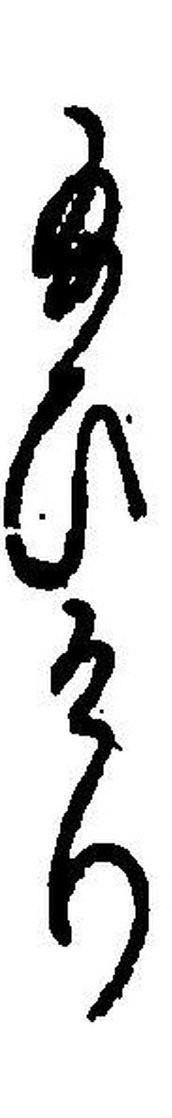給ひけり
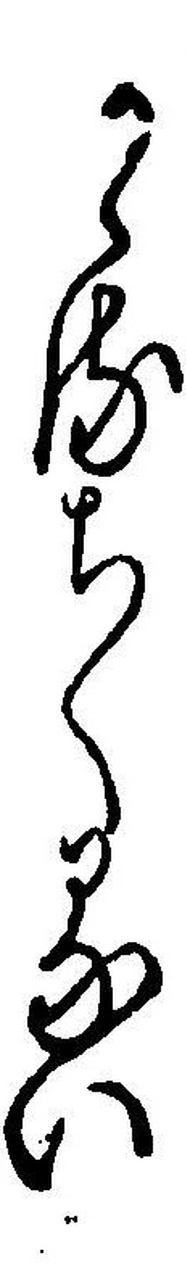かゝるちくるい
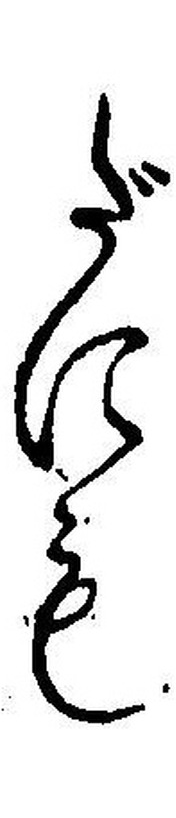だにも
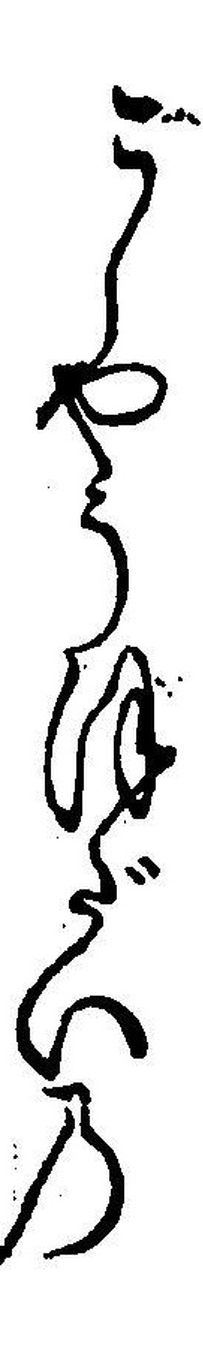ごしやうぼだいの
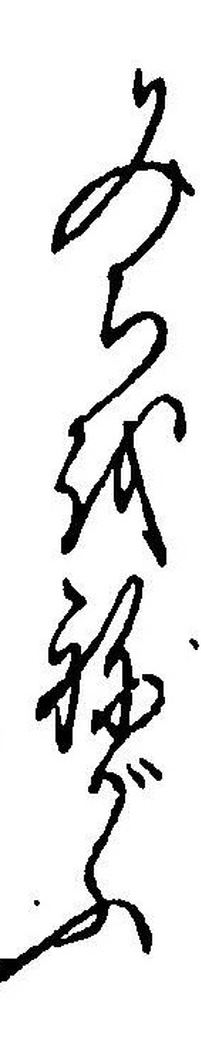みちをねがふ
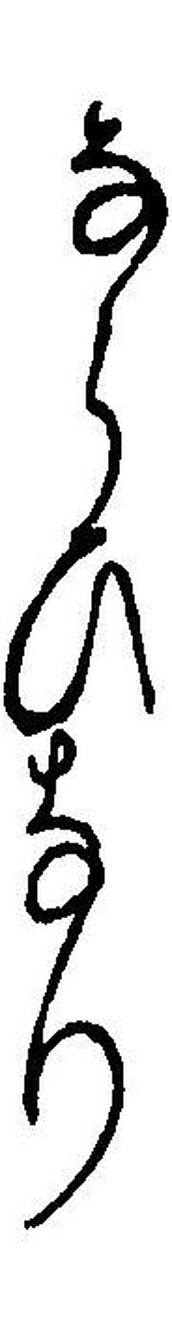ならひなり
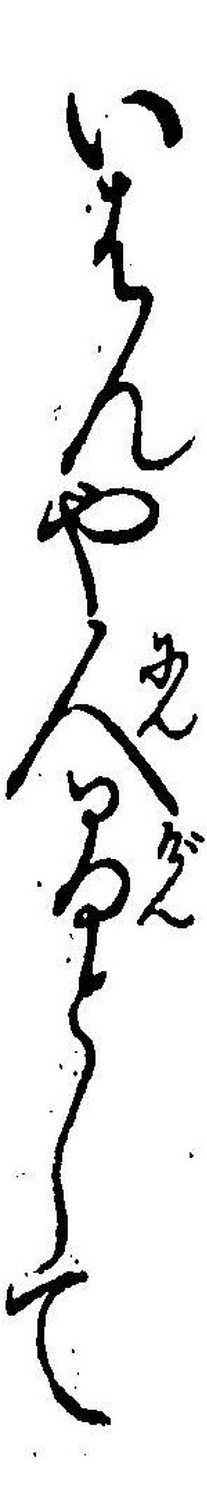いはんや人間として
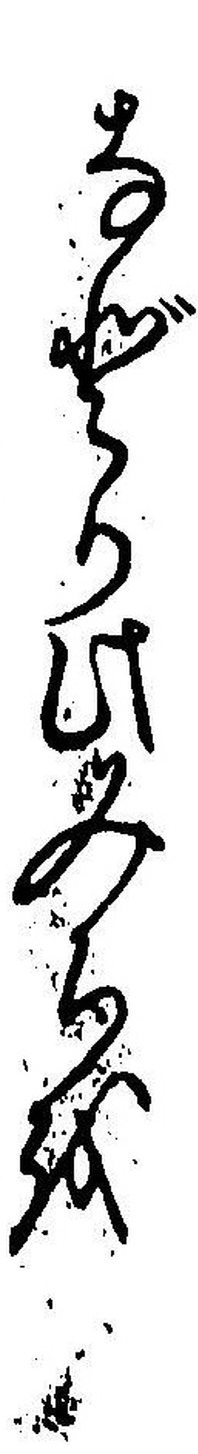などか此みちを
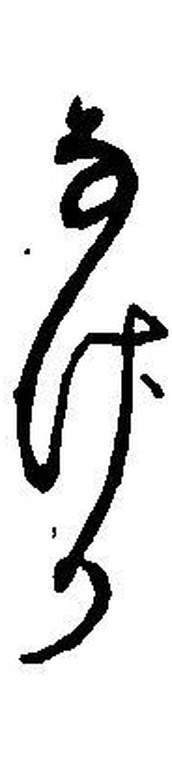なげか
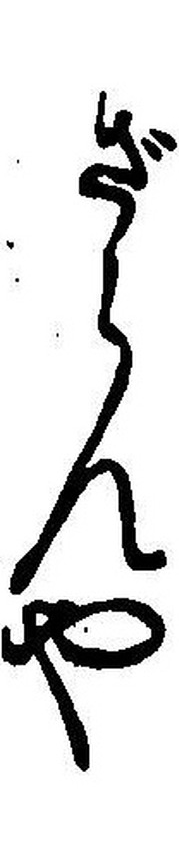ざらんや
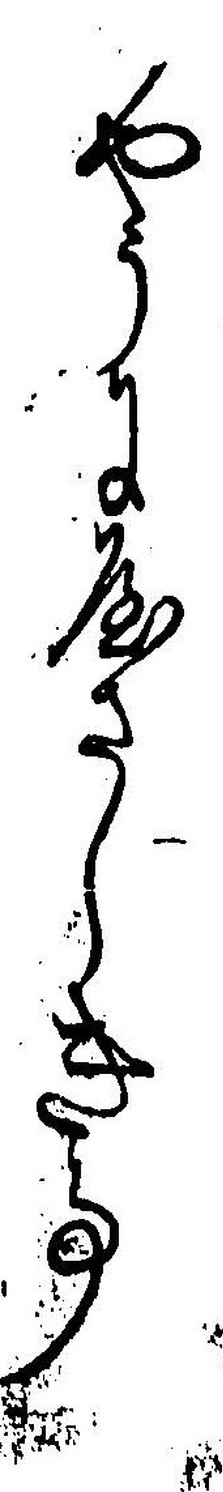やうにやさしき事
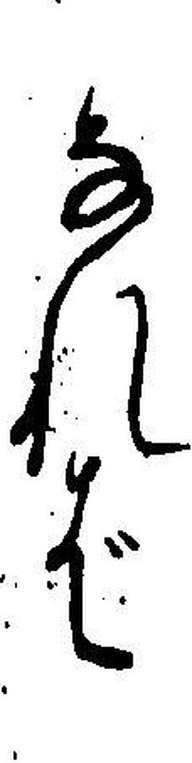なれば
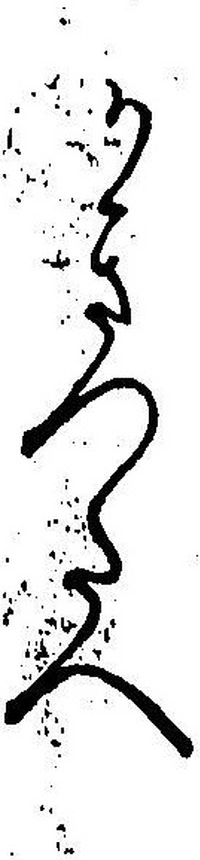かきつたへ
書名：木幡きつね
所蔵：東京大学総合図書館 General Library in the University of Tokyo, JAPAN
